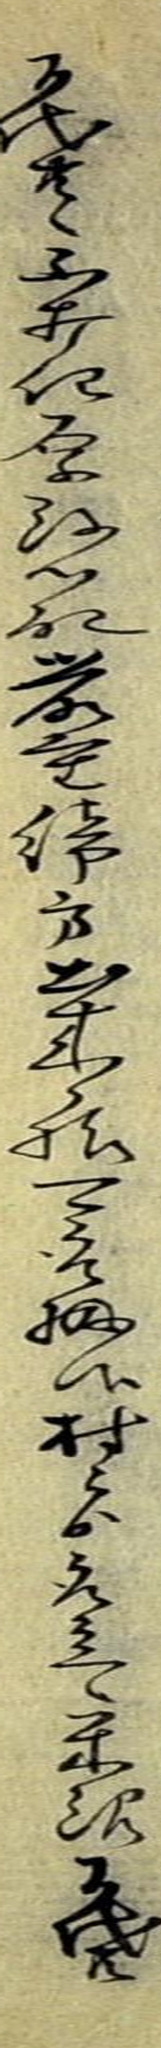下代共へ不打任厚致心配厳重締方出来候様可取扱候村々ゟ取立候米銀下代共
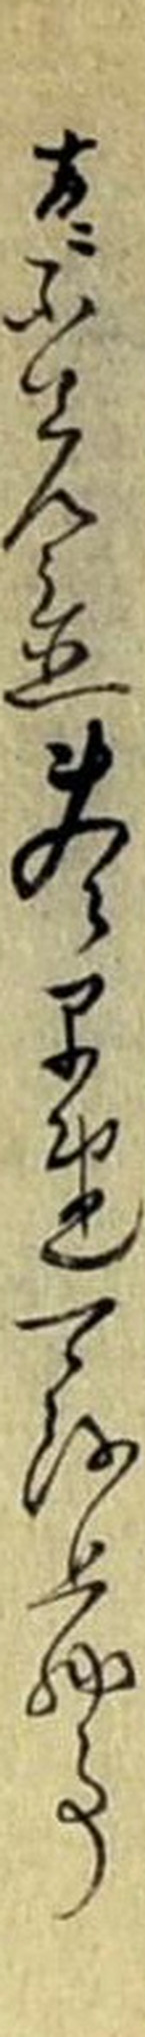方ニ不差置夫々早速可致上納事
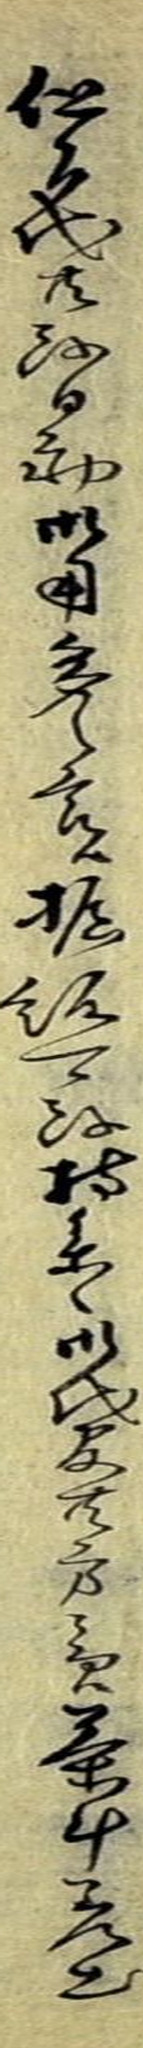但下代共致日勤御用多之節ハ握飯可致持参候御代官共方ニ而ハ茶計差出
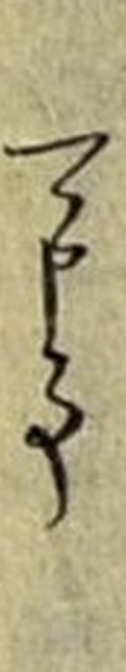可申事
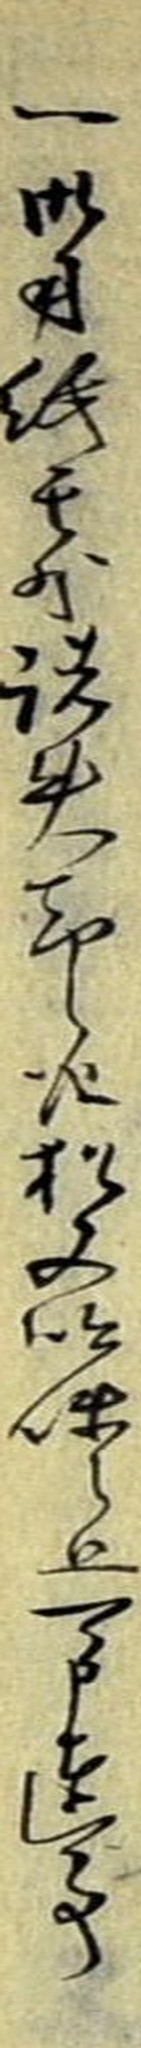一御用紙其外諸失却之儀猶又吟味之上可申達事
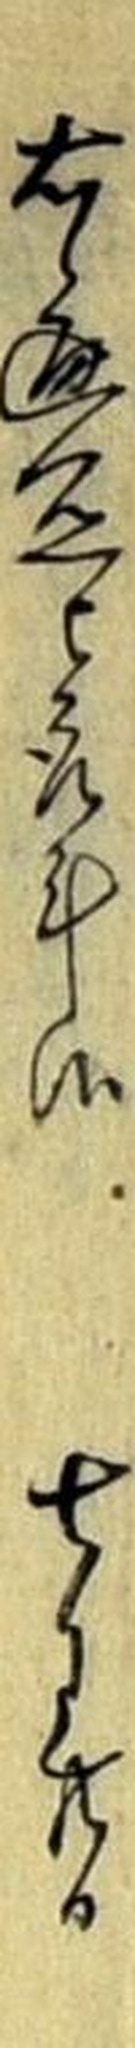右之通宜被取計候七月廿日
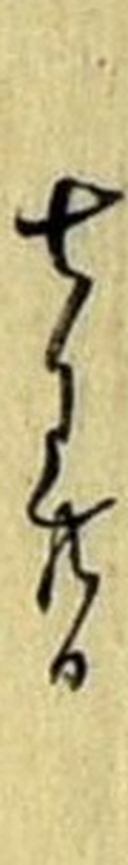三月廿日

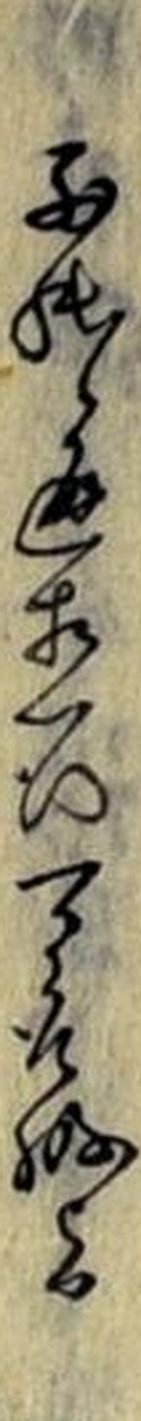別紙之通相心得可取扱旨
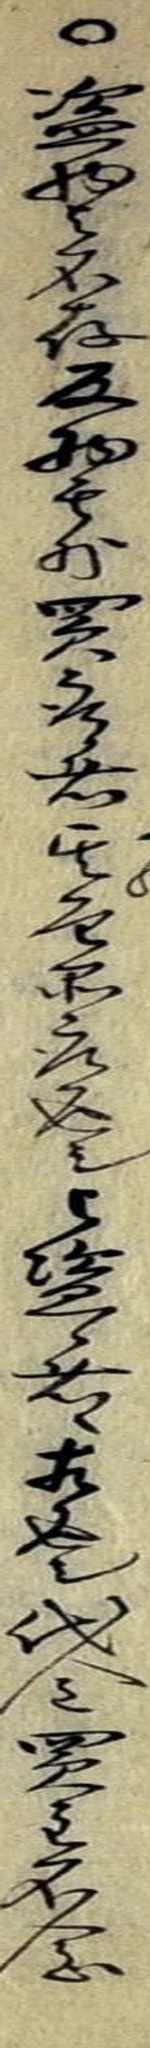〇盗物与不存反物其外買取候者其届品取返シ被盗候者へ相返シ代金買主不念
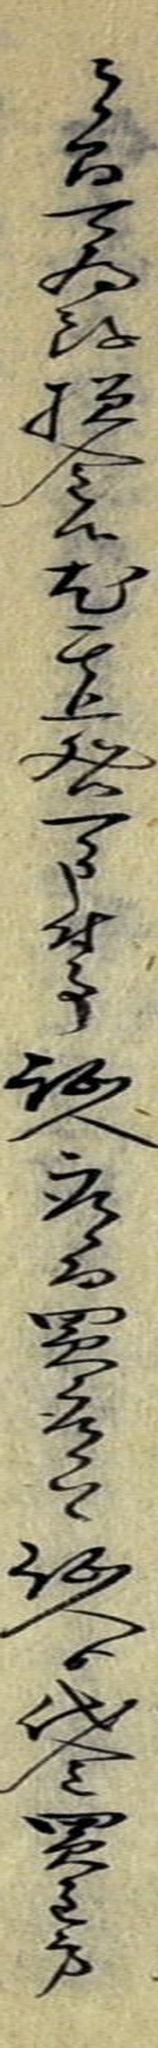ニ候間可為致損金候尤其上咎可申付事証人取候而買取候ハヽ証人ゟ代金買主方
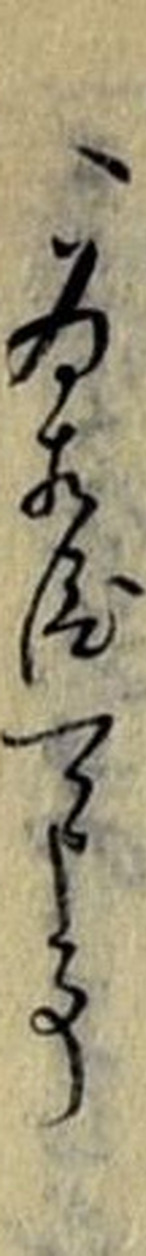へ為相渡可申事
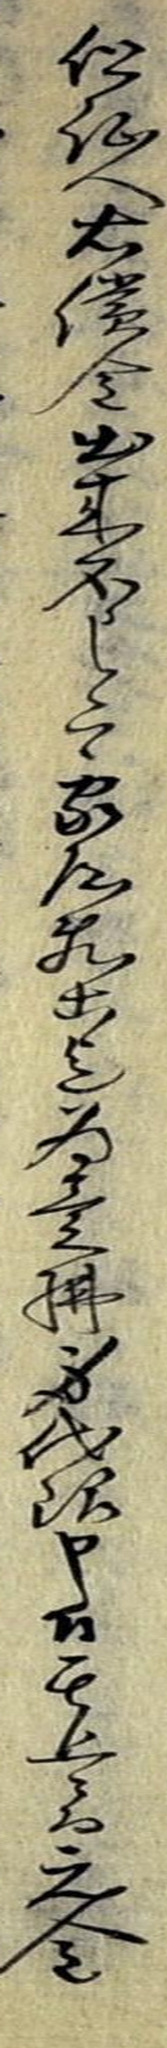但証人右償金出来不申候ハヽ家屋敷等迄為売払身代銀申付其上ニ而元金
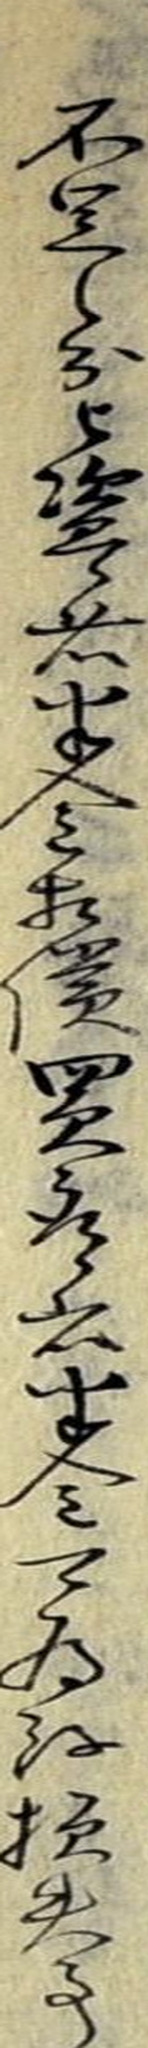不足之分被盗候者半金相償買取候者半金可為致損失事
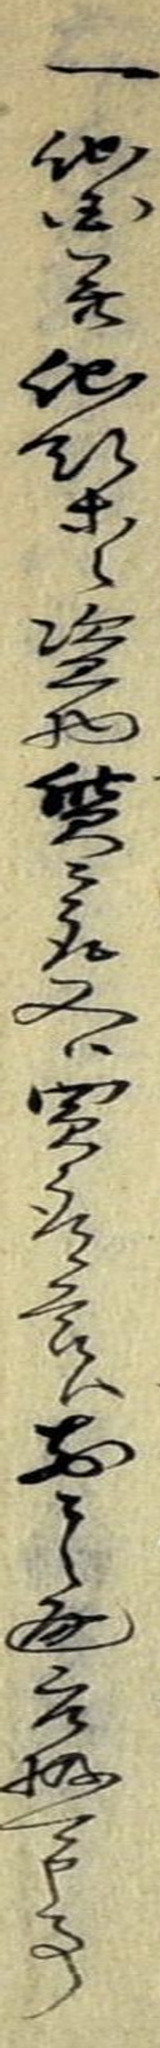一他国并他領等之盗物質ニ取又ハ買取候節ハ前々之通取扱可申事
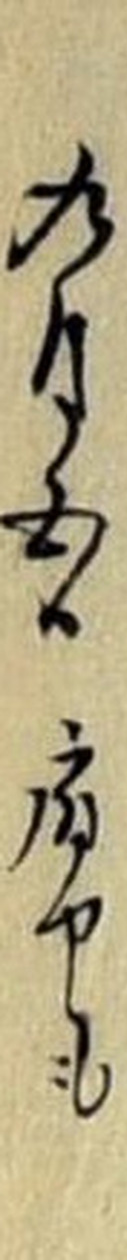九月五日府中へも
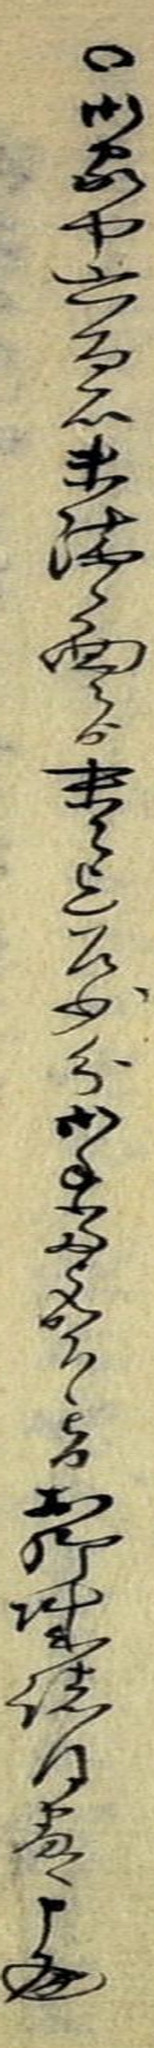〇御家中六百石未満之面々ゟ末々迄乍少分御手当被成下候旨於御城諸月番へ申通
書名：命令之部 五
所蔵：福井県文書館 Fukui Prefectural Archives
